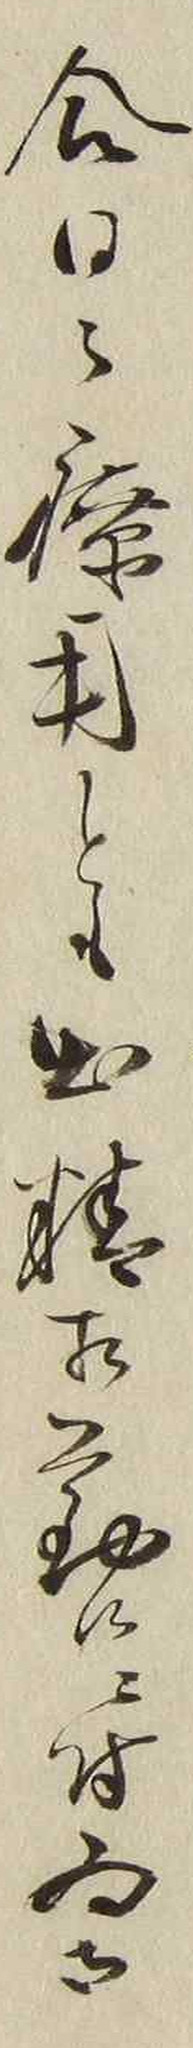合日々療用とも出精相勤候に付為御

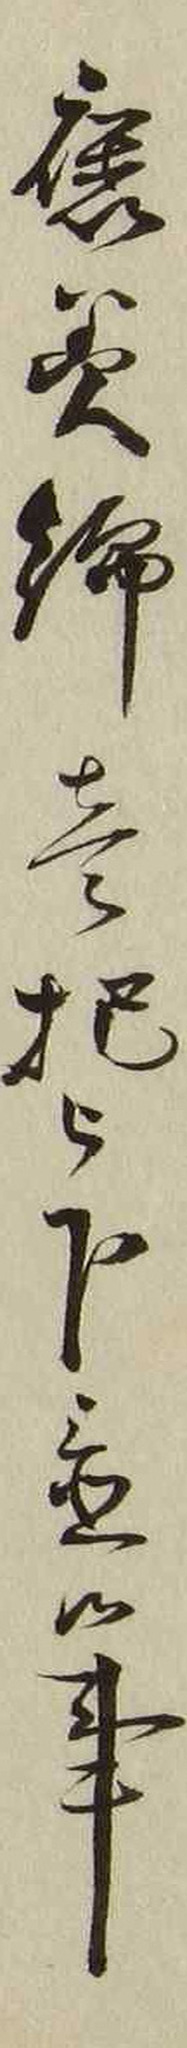褒美綿壱把被下置候事
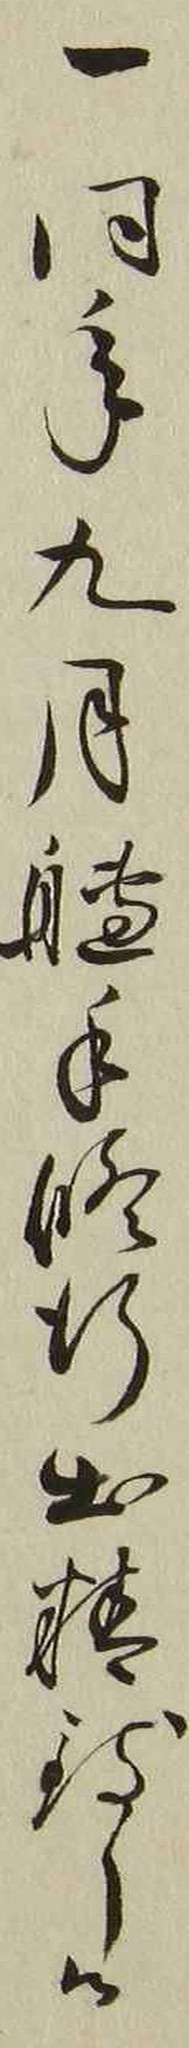一同年九月艫手修行出精致し候
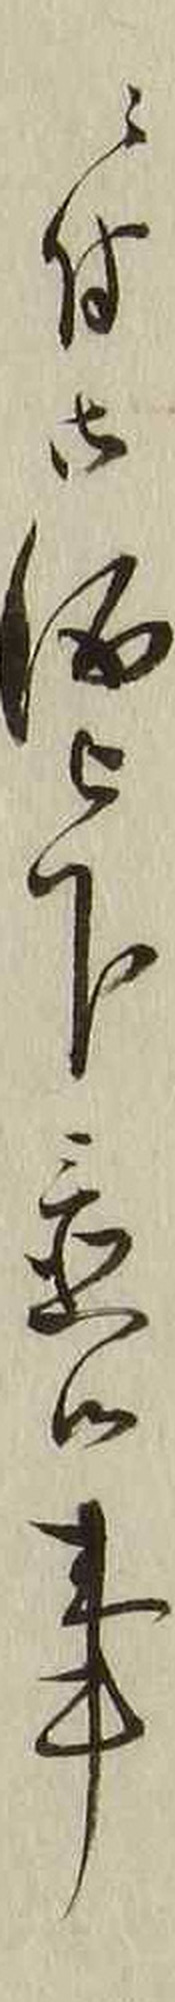に付御酒被下置候事
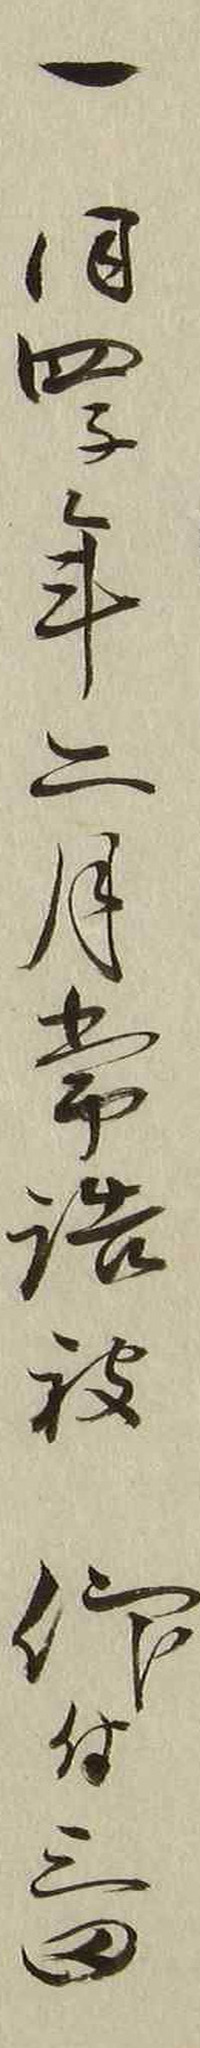一同四子年二月常詰被仰付三田
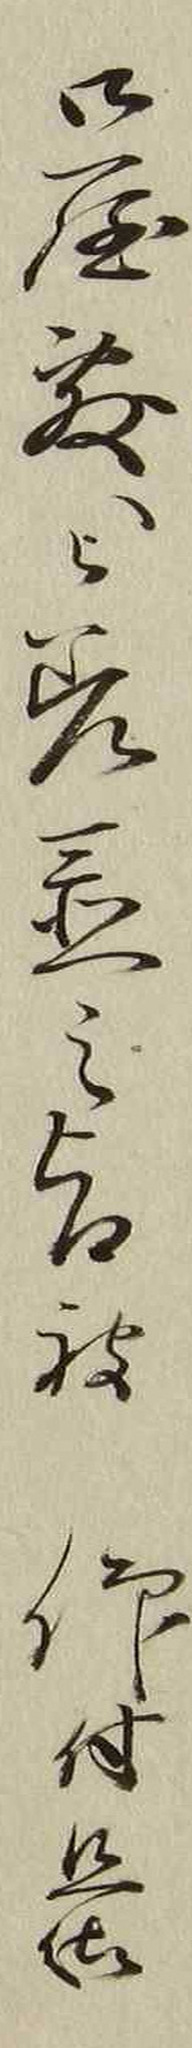御屋敷へ被差置之旨被仰付且御
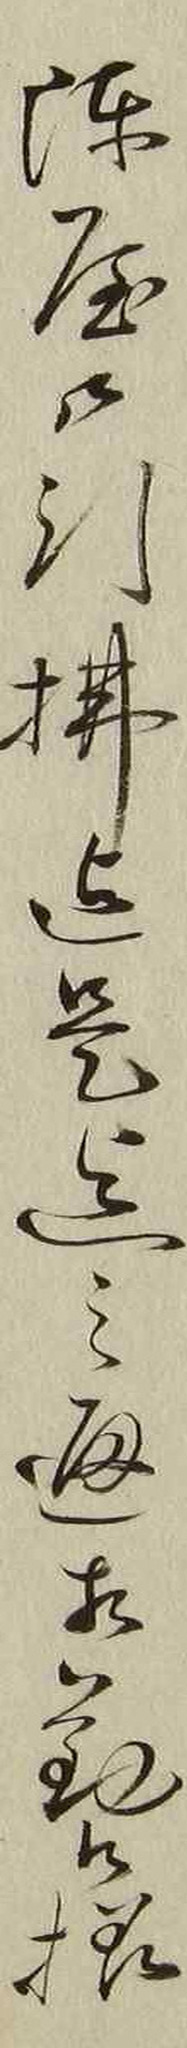陣屋御引払迄是迄之通相勤候様
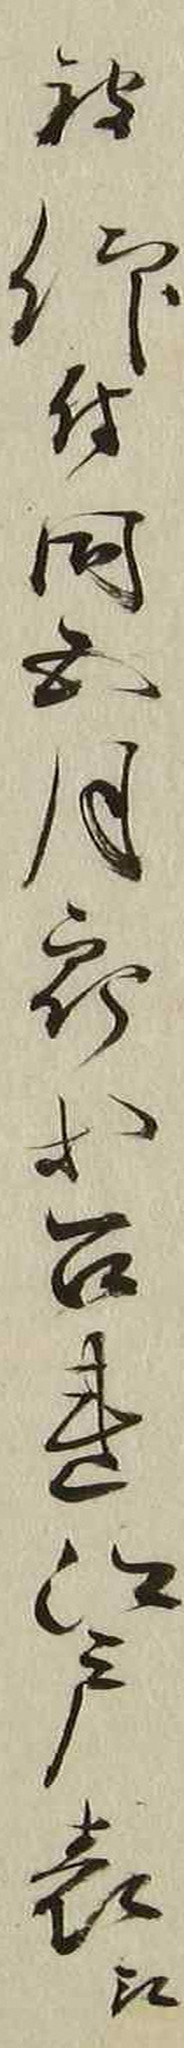被仰付同五月郎等召連江戸表え
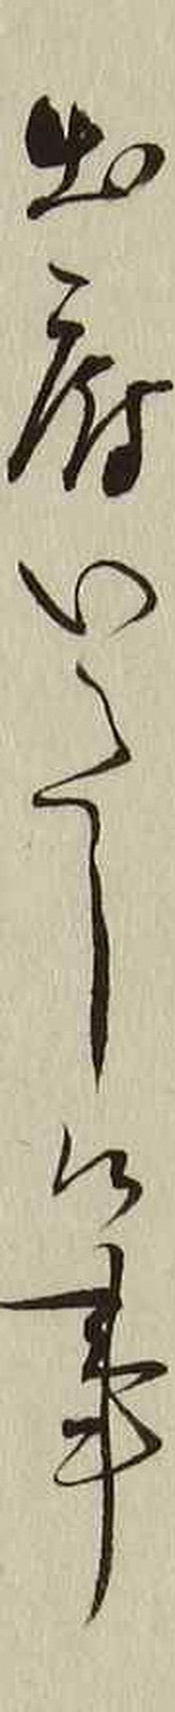出府いたし候事
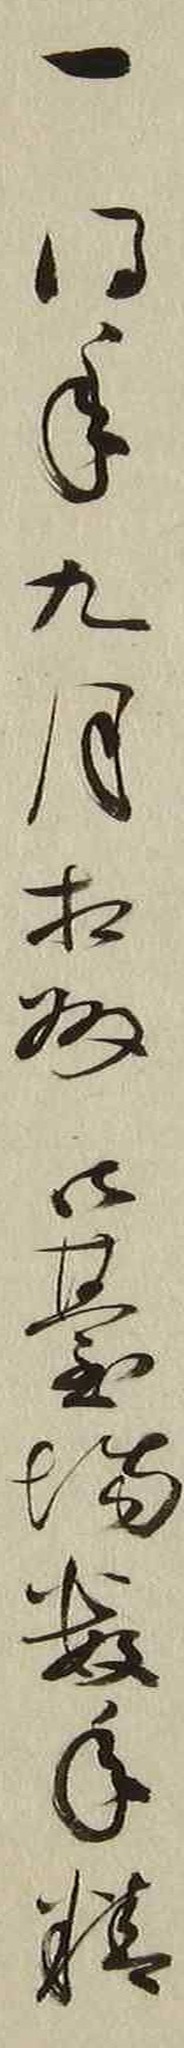一同年九月相州御台場数年精
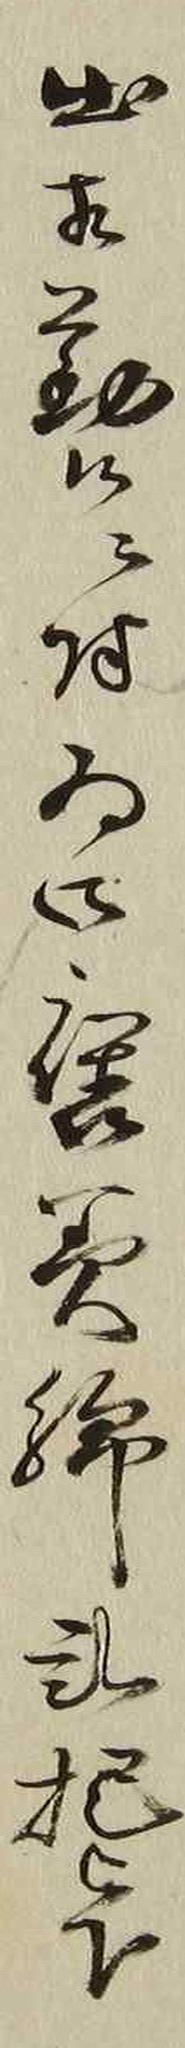出相勤候に付為御褒美綿弐把被下
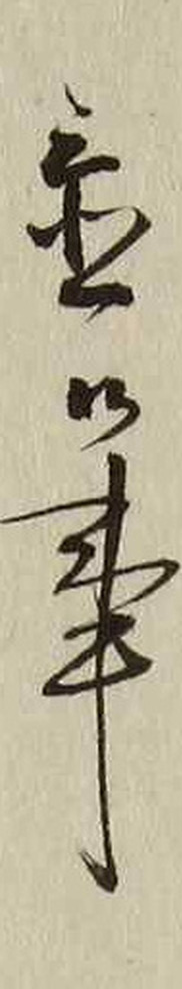置候事
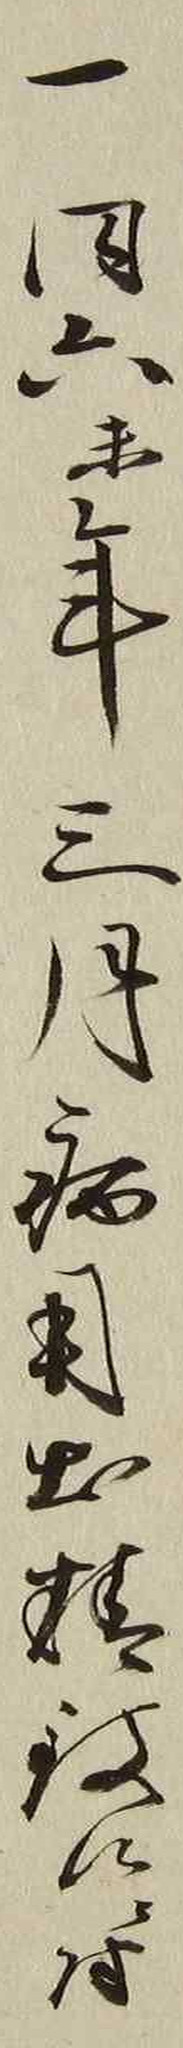一同六未年三月病用出精致候に付
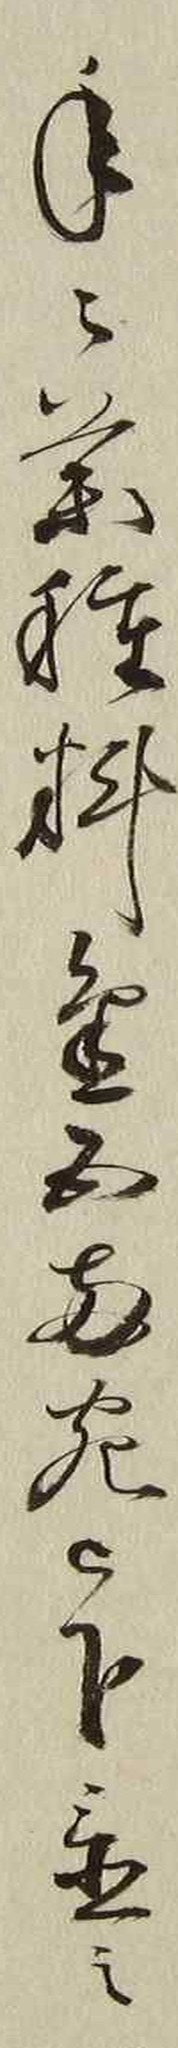年々薬種料金五両宛被下置之
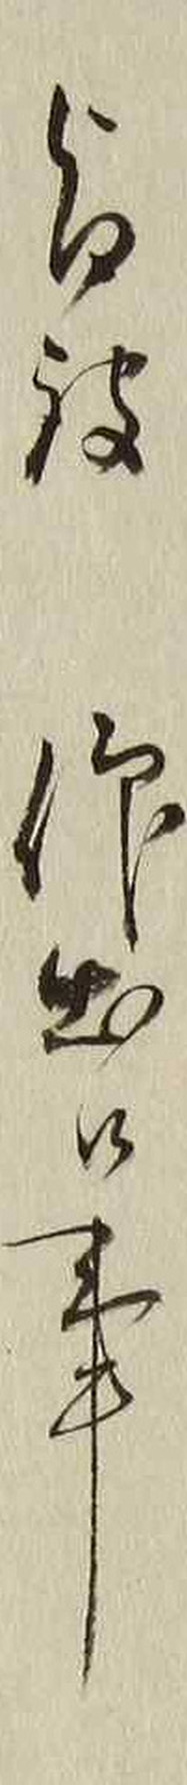旨被仰出候事
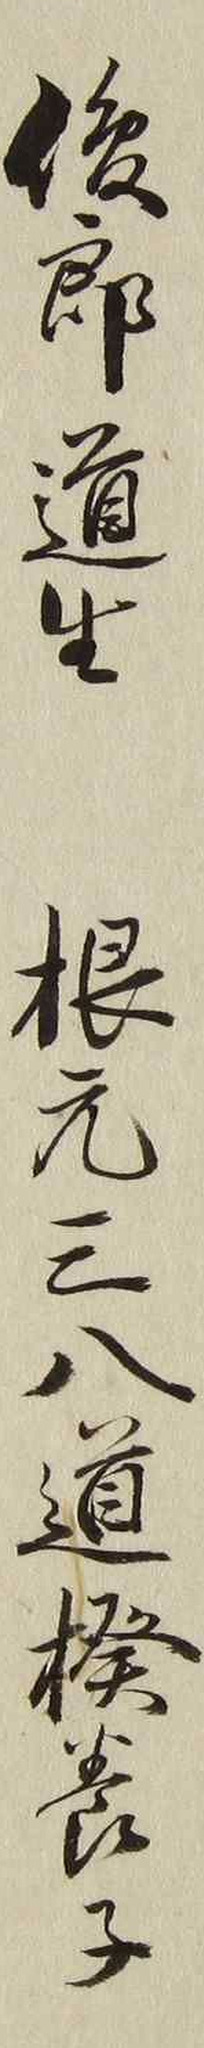俊郎道生根元三八道揆養子
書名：諸士系譜　巻之157　ね之部1
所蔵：会津若松市立会津図書館
